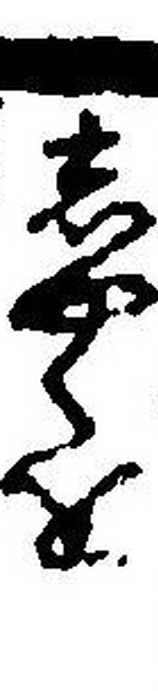しやくを
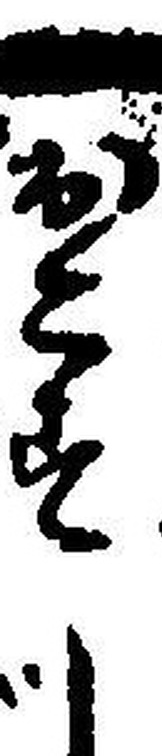おこす
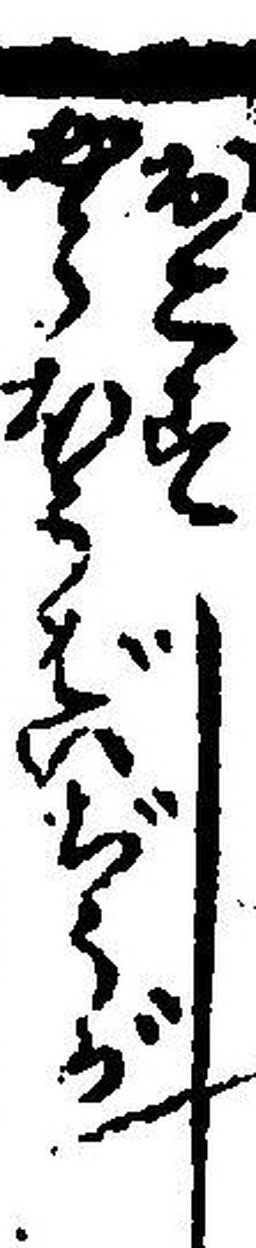やらほうばいぢうが
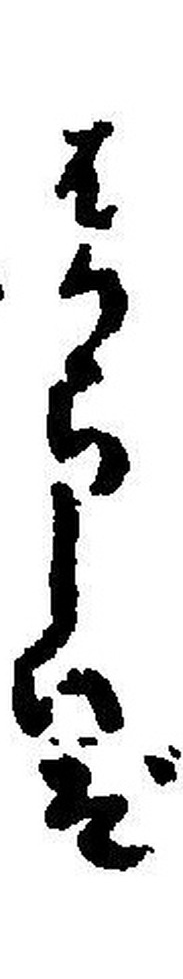はからしいぞ？
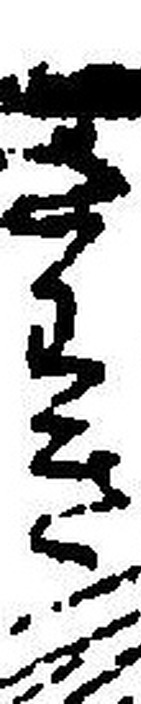さわき
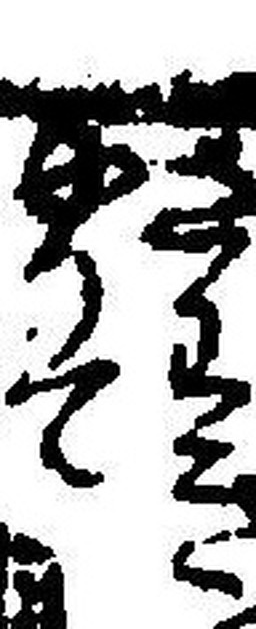やりて
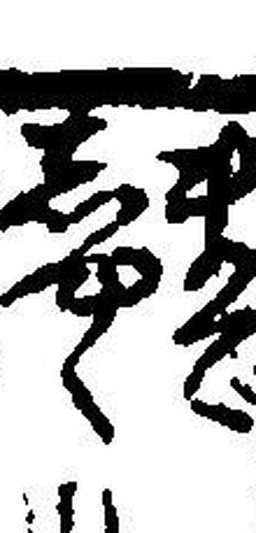しやく
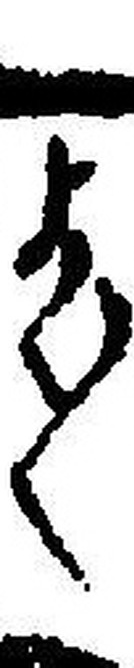よく〳〵
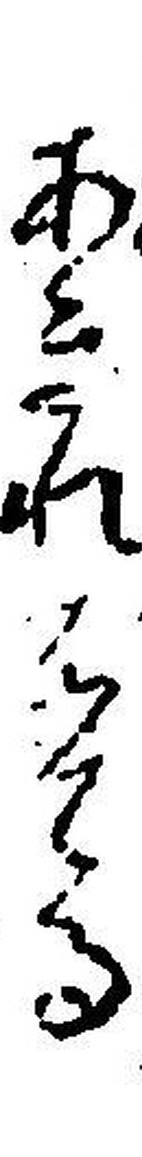あきれはてる

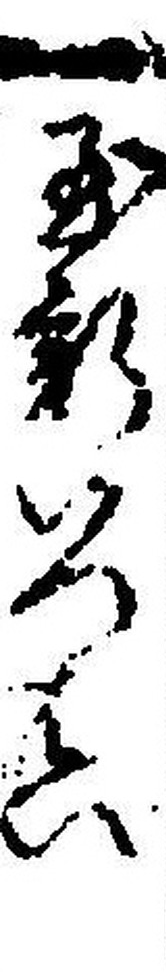玉新いつはい
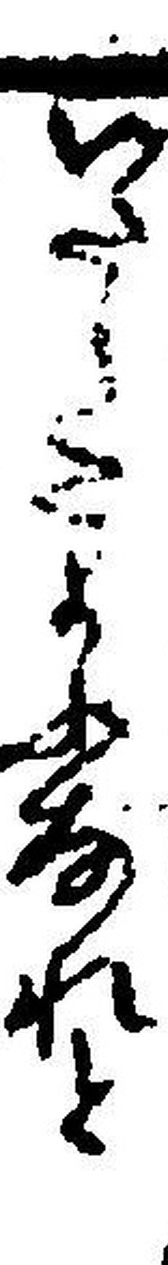いたしたよふなれと
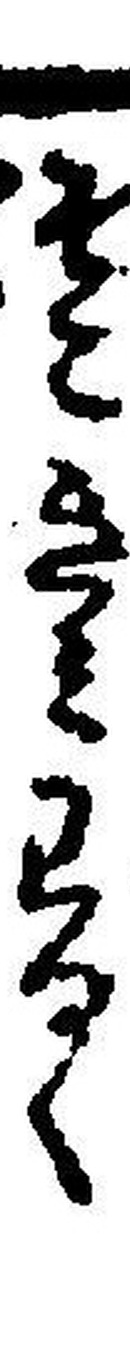そこきみわるく
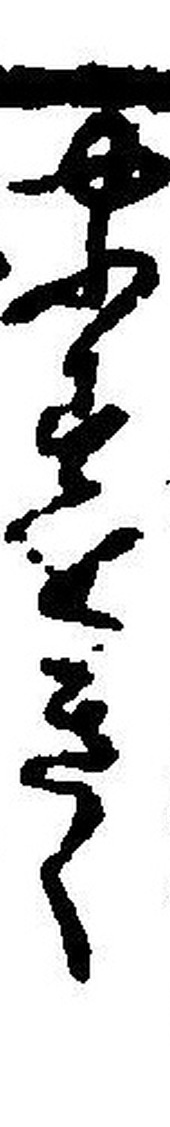やふすをきく
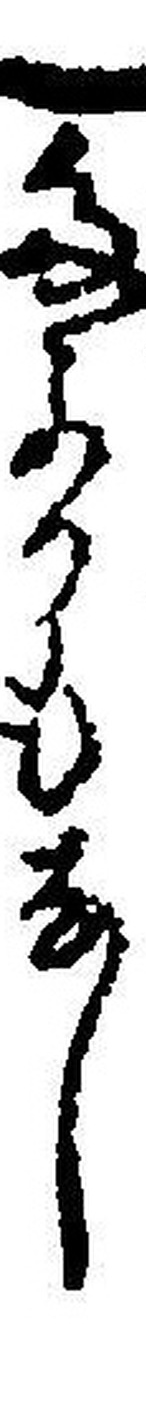たよりもなし
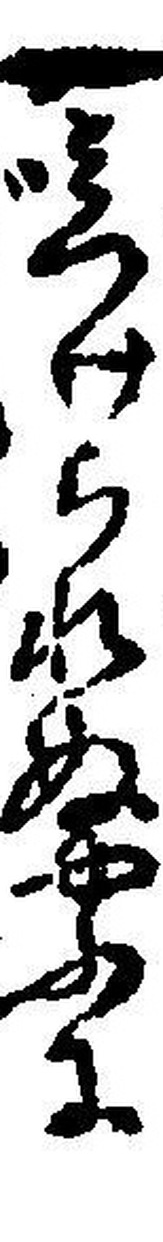みつけられぬやふに
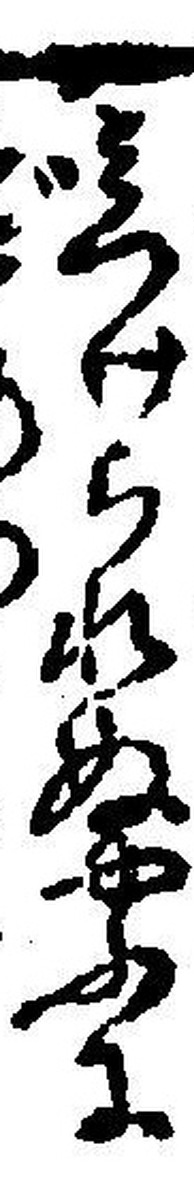みつけられぬやふに
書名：間違狐之女郎買 / 市場通笑作
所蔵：東京大学総合図書館 General Library in the University of Tokyo, JAPAN
